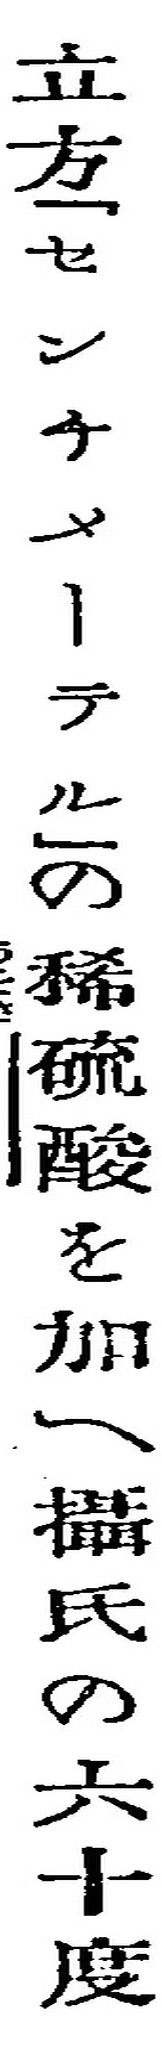立方[センチメーテル]の稀硫酸を加へ摂氏の六十度
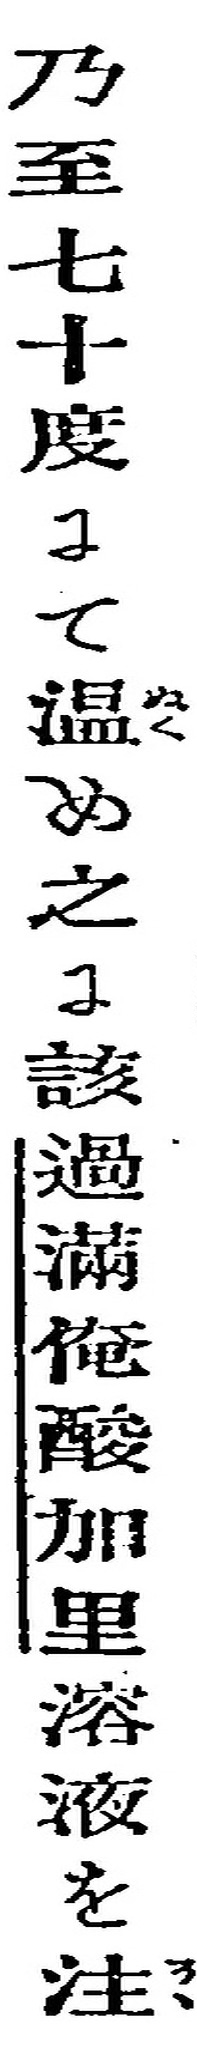乃至七十度にて温め之に該過滿俺酸加里溶液を注

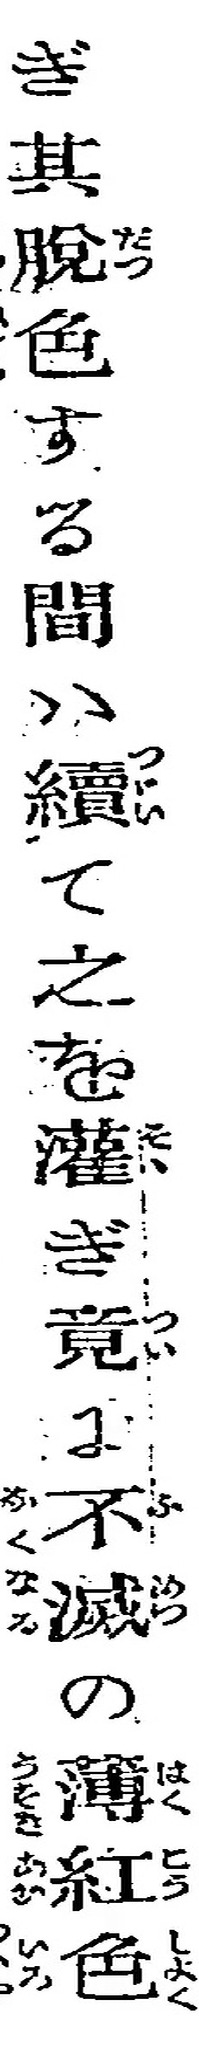ぎ其脱色する間は續て之を灌ぎ竟に不滅の薄紅色
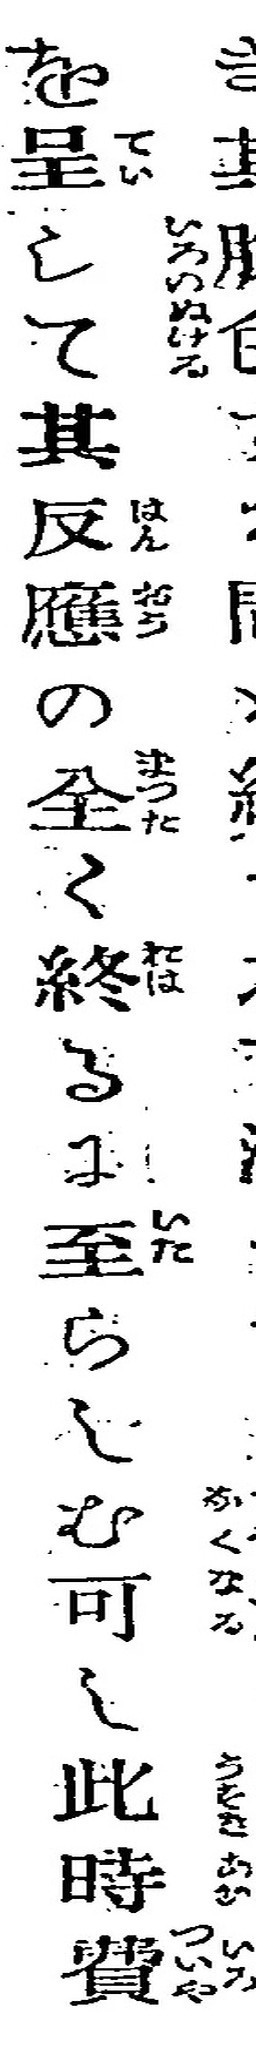を呈して其反應の全く終るに至らしむ可し此時費
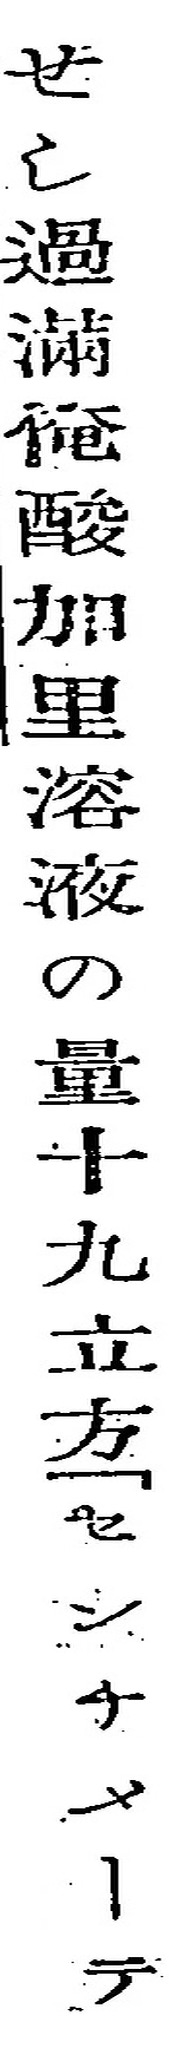せし過滿俺酸加里溶液の量十九立方[センチメーテ
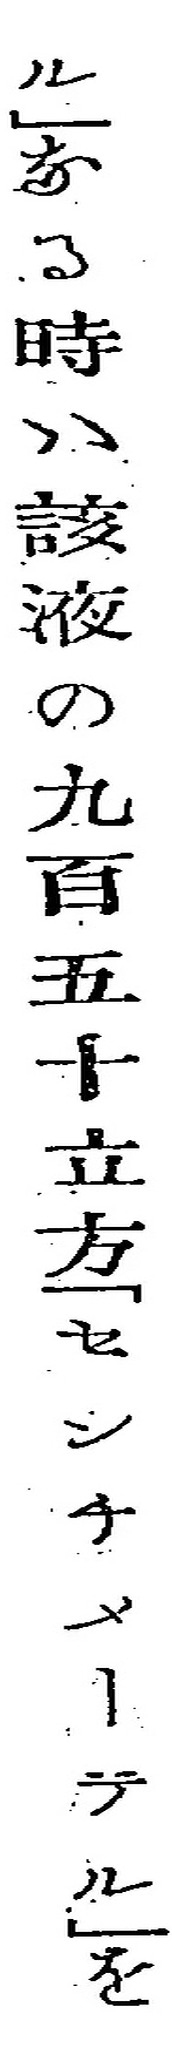ル]なる時は該液の九百五十立方[センチメーテル]を
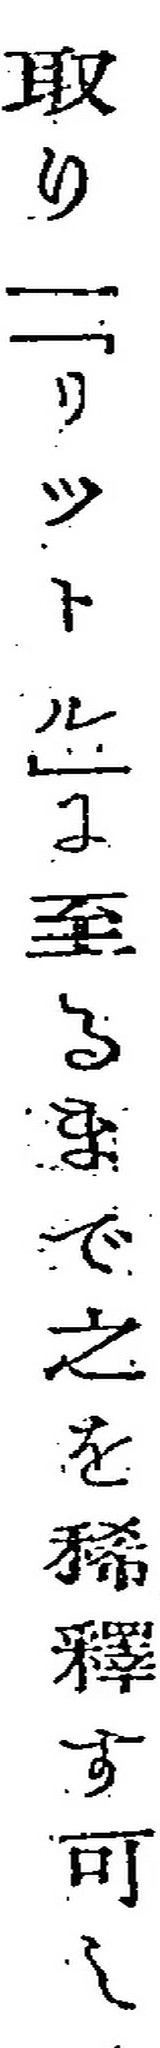取り一[リツトル]に至るまで之を稀釈す可し
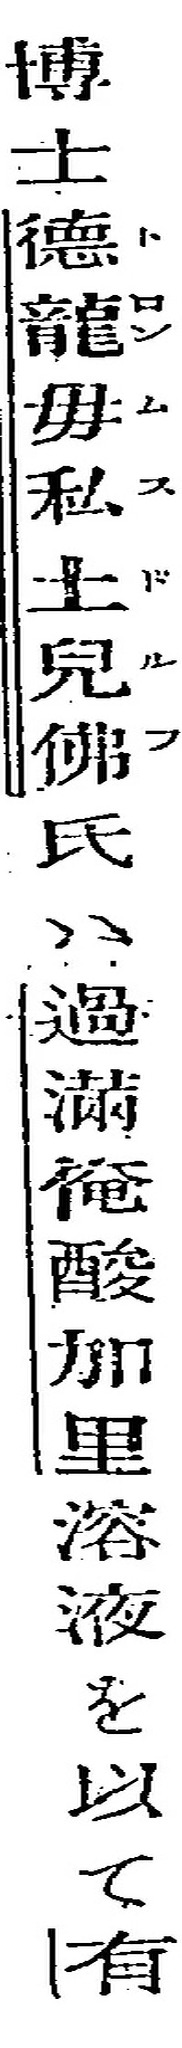博士德龍母私土兒佛氏は過滿俺酸加里溶液を以て有
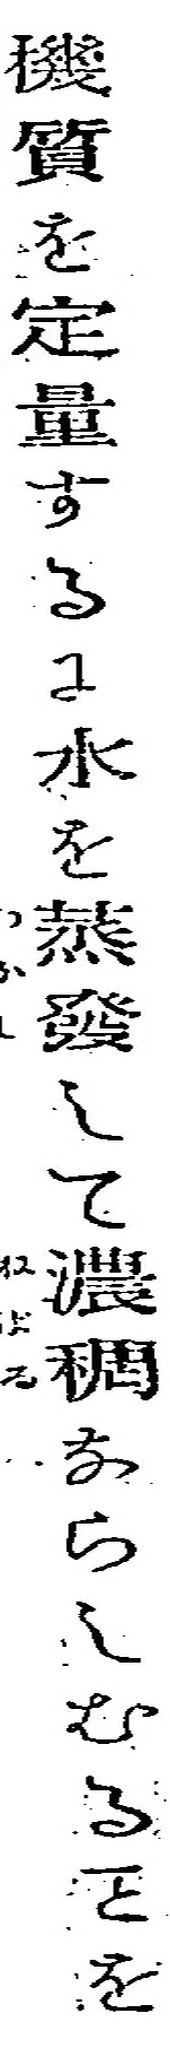機質を定量するに水を蒸發して濃稠ならしむることを
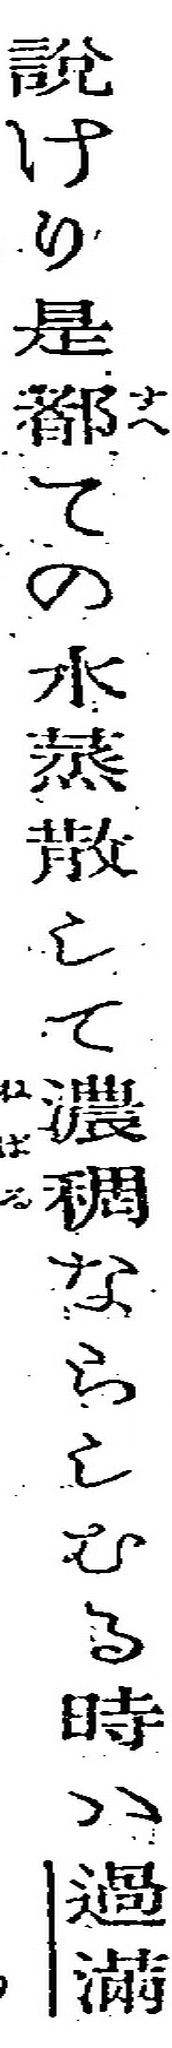説けり是都ての水蒸散して濃稠ならしむる時は過滿
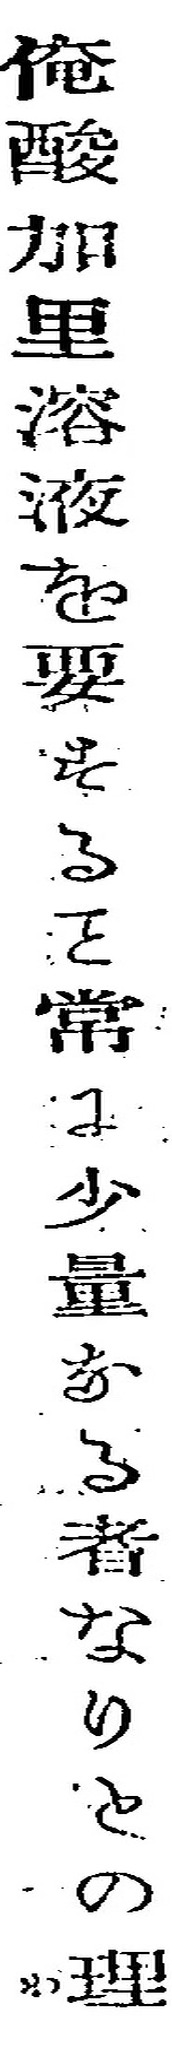俺酸加里溶液を要すること常に少量なる者なりとの理
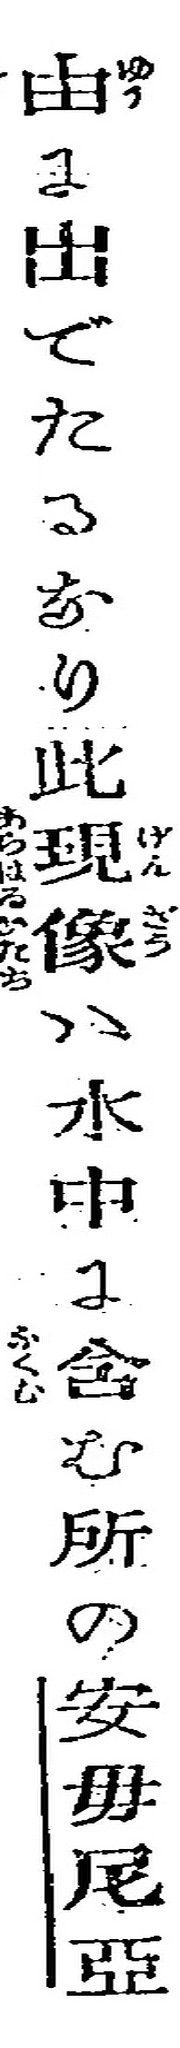由に出でたるなり此現像は水中に含む所の安母尼亞
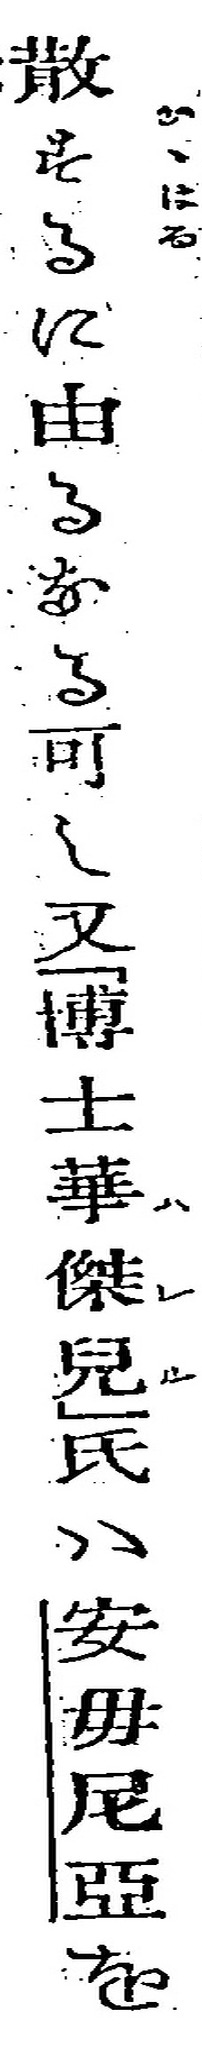に關係由るなる可し[博士華傑兒]安母尼亞を
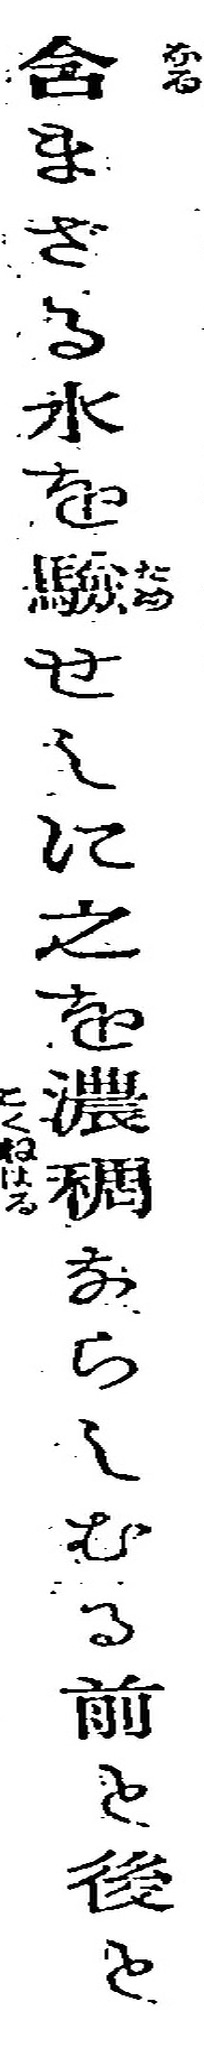含まざる水を験せしに之を濃稠ならしむる前と後と
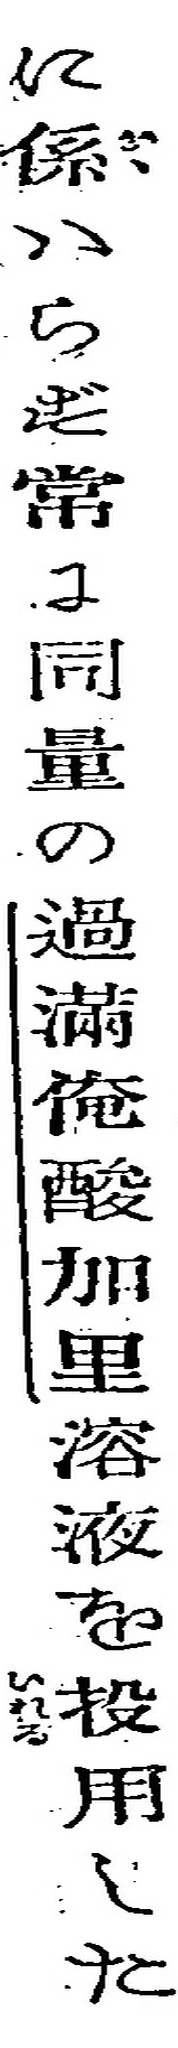に係はらず常に同量の過滿俺酸加里溶液を投用した
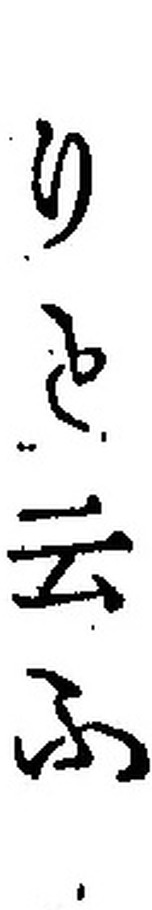りと云ふ
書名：飲水の心得 : 伝染病の予防
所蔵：国立国会図書館 National Diet Library, JAPAN
